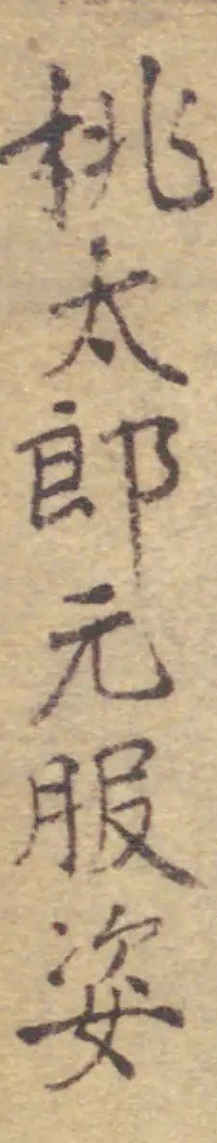桃太郎元服姿

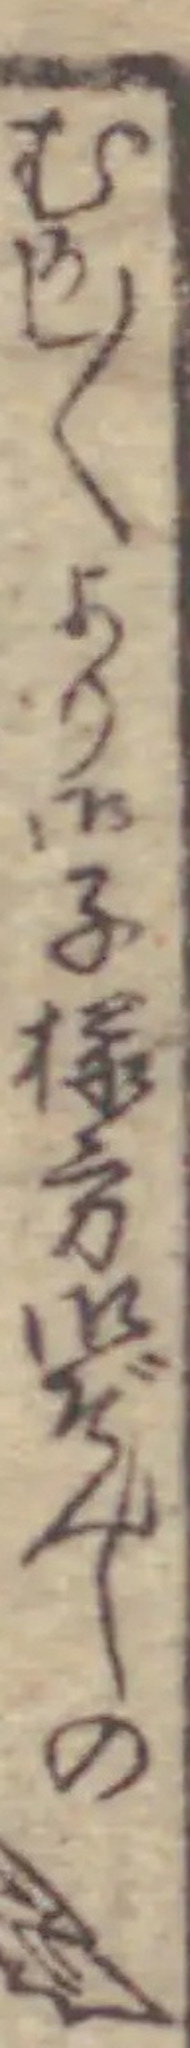むかし〳〵より御子様方御ぞんしの
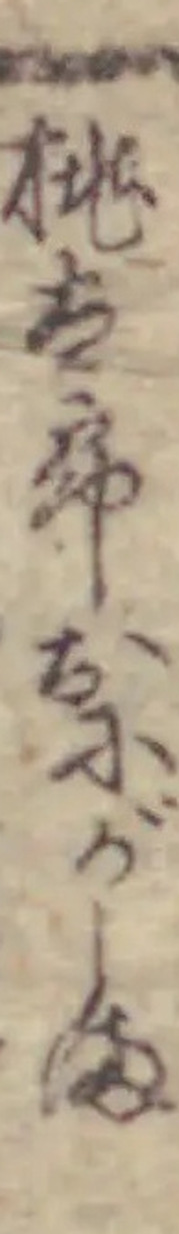桃太郎おにがしま
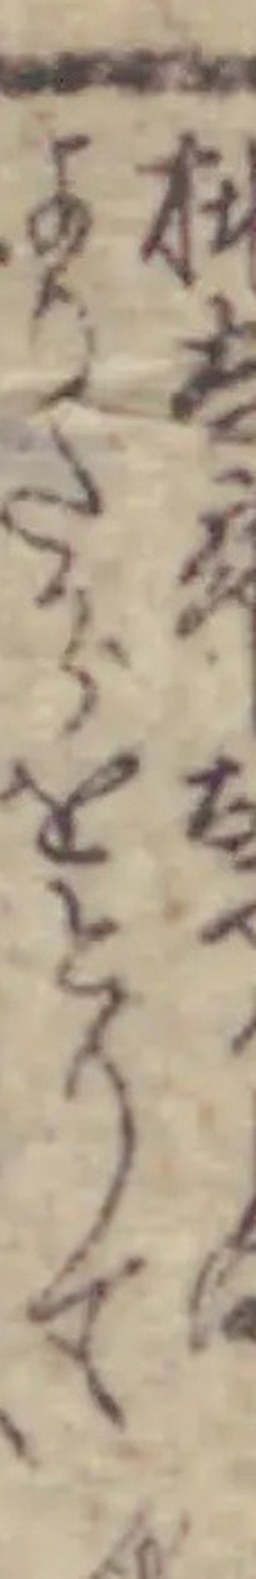よりたからをとりて
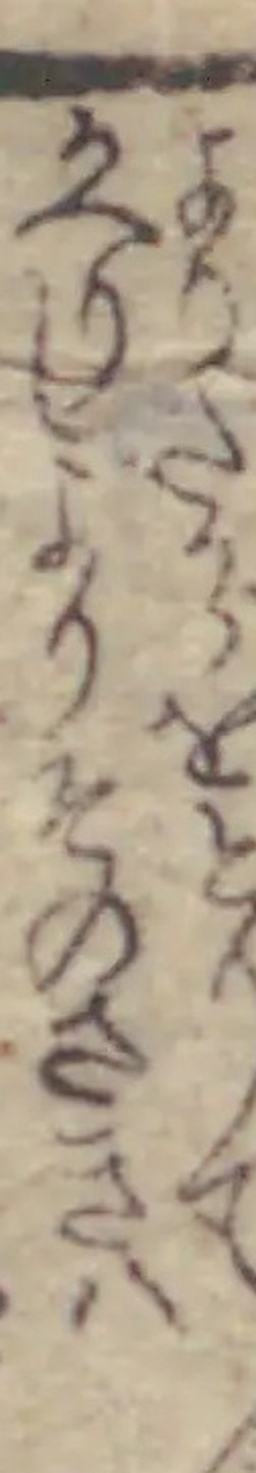かへりしよりそのさきは
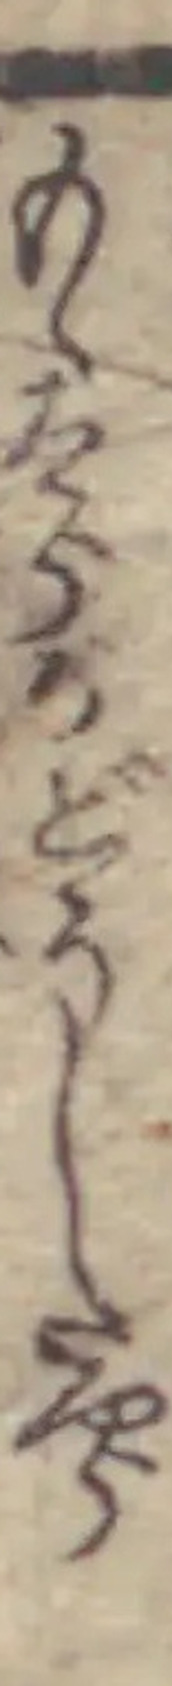もゝ太郎がどうしたやら
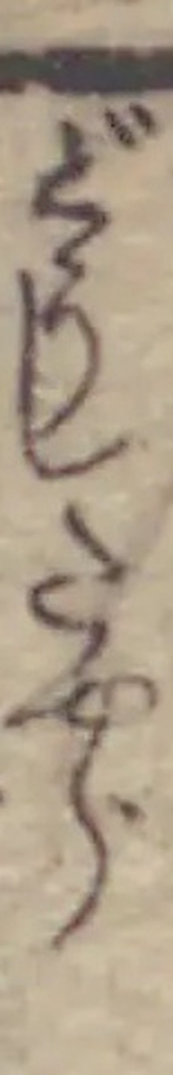どうしたやら
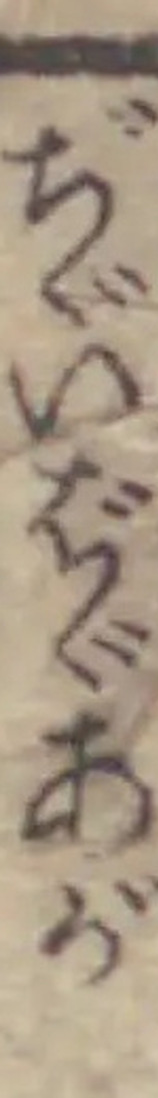ぢゞいばゞあが
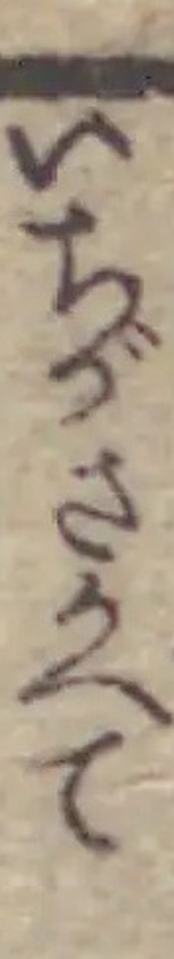いちがさかへて
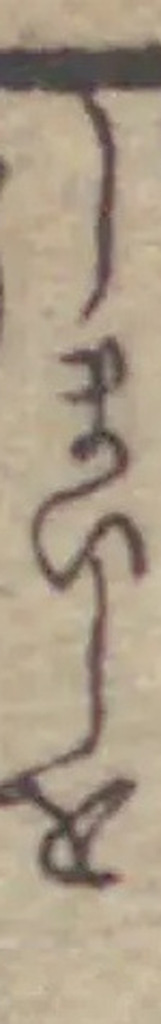しまいしを
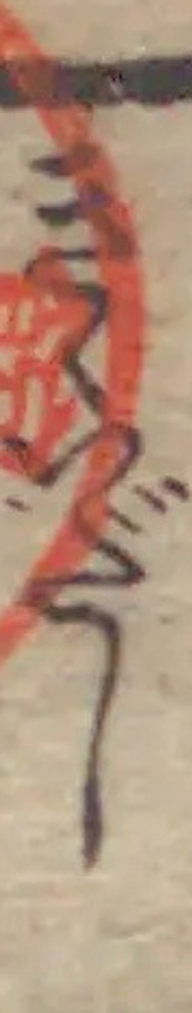きゝいだし
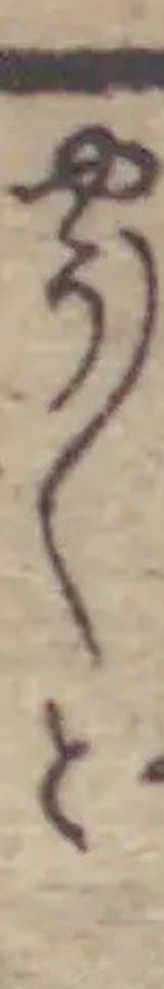やう〳〵と
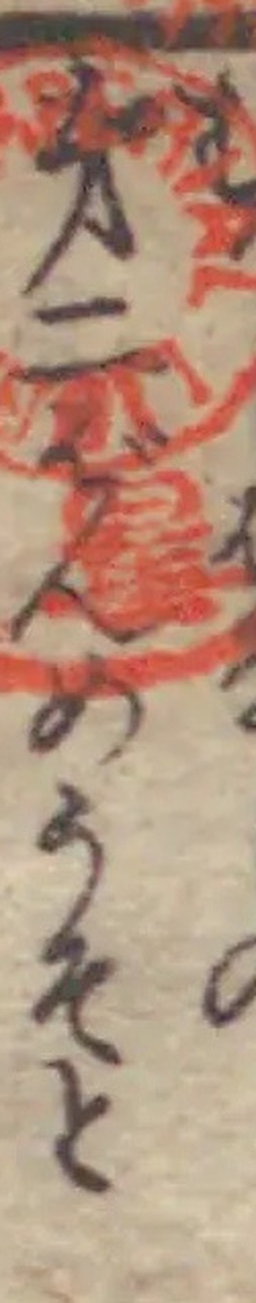第二ばんめうそと
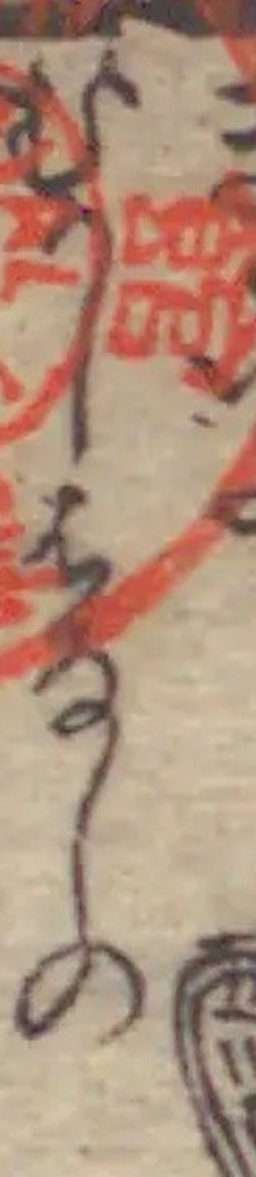むかしはなしの
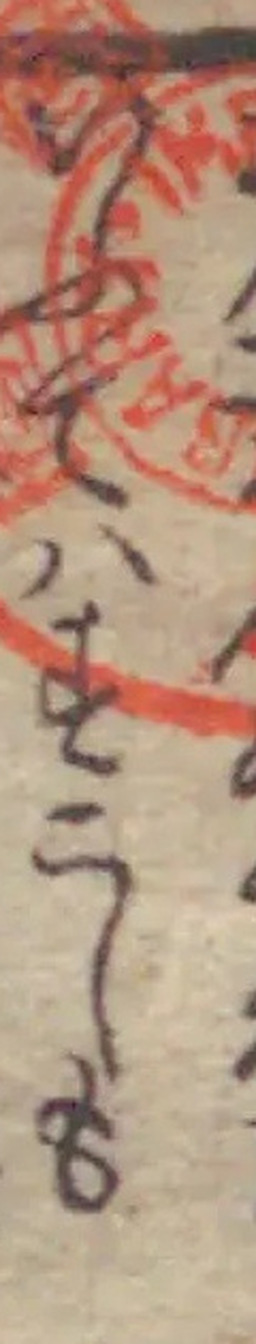いふてはすこしも
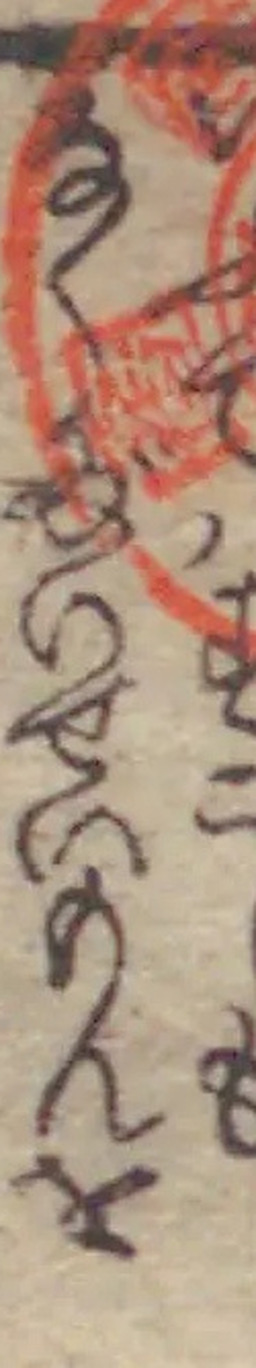なくだいせいもんを
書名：桃太郎元服姿 2巻
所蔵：国立国会図書館 National Diet Library, JAPAN
